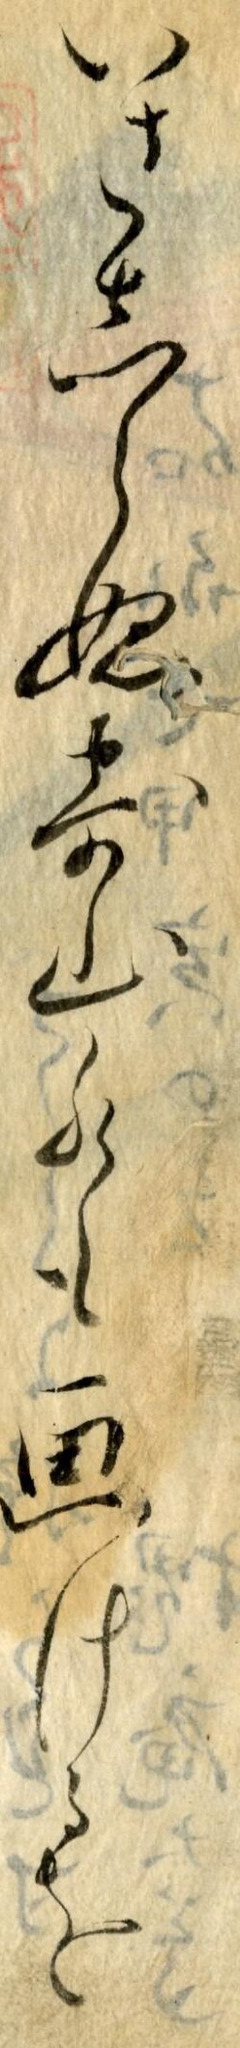いさしらぬ寄山水も画けるを
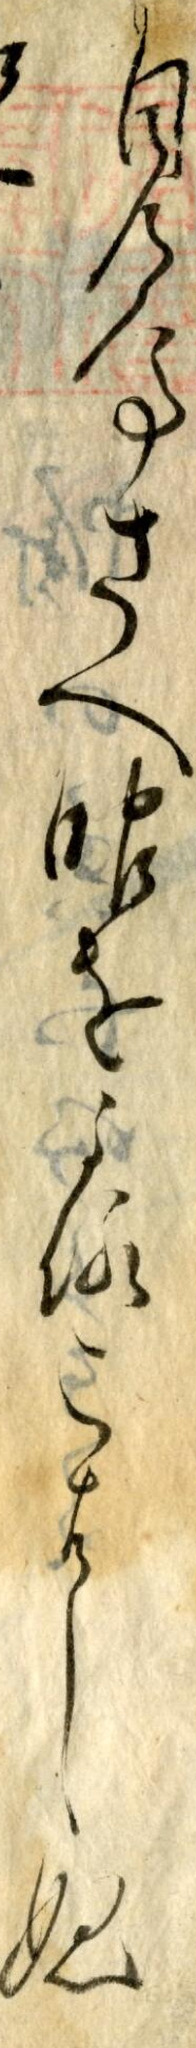自の事さへ眼をよろこはしぬ
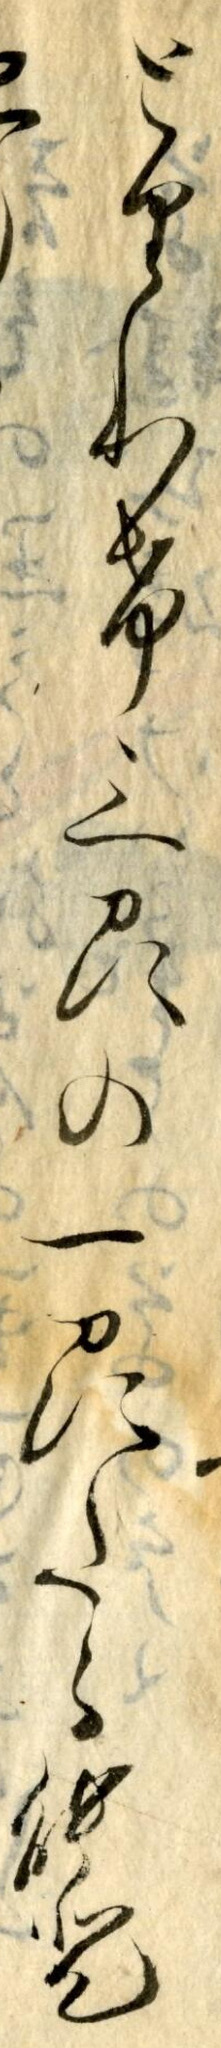とりわけ三州の一州たる能登
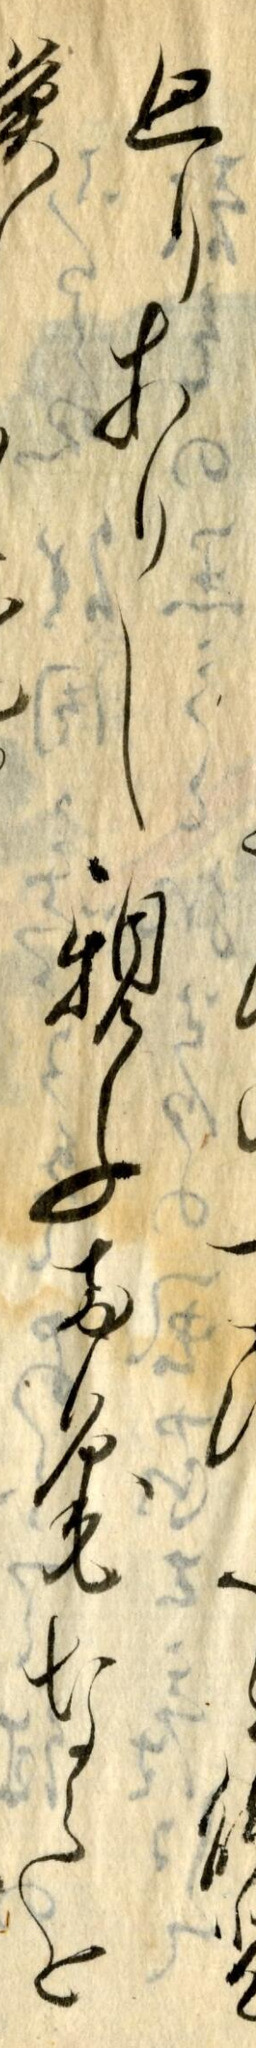廻りありし親子両筆なるを
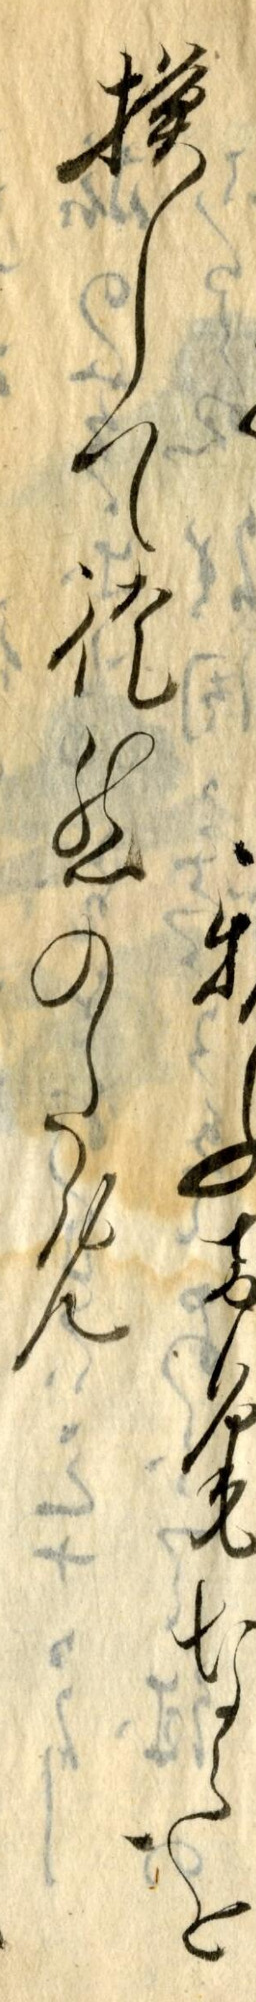摸して徒然のため
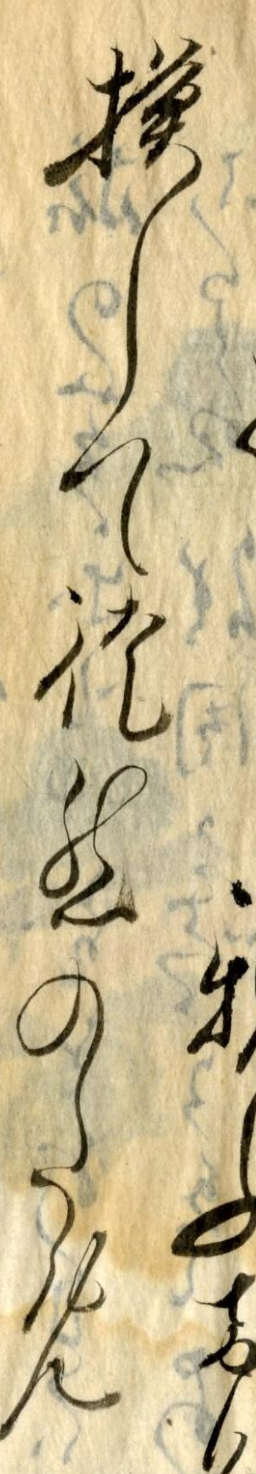摸して徒然のため
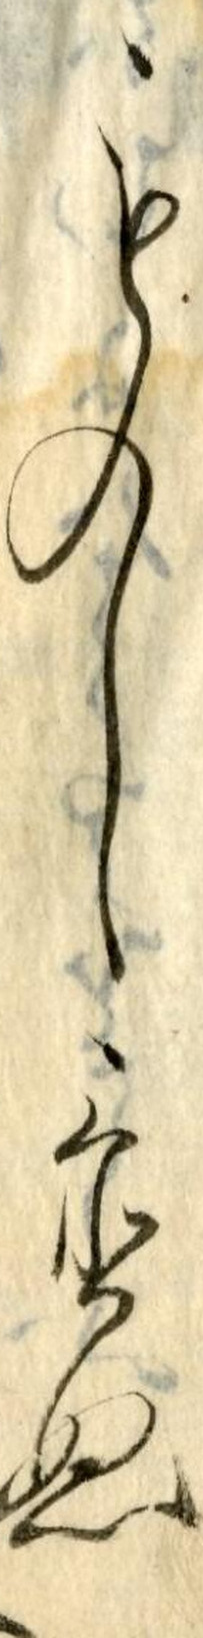ものし置ぬ
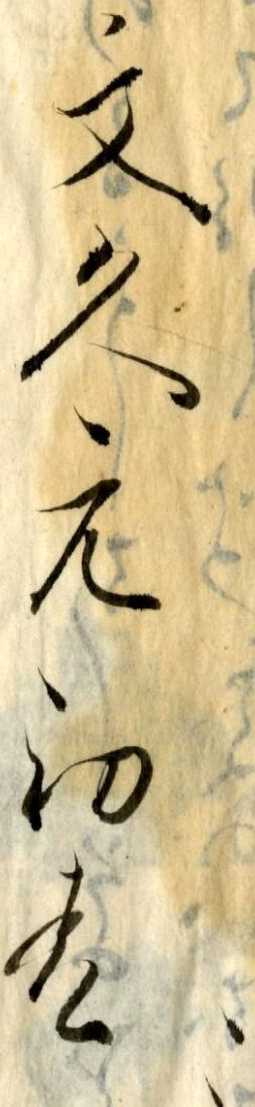文久元初春
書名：能登めぐり
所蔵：Ishikawa Prefectural Library
